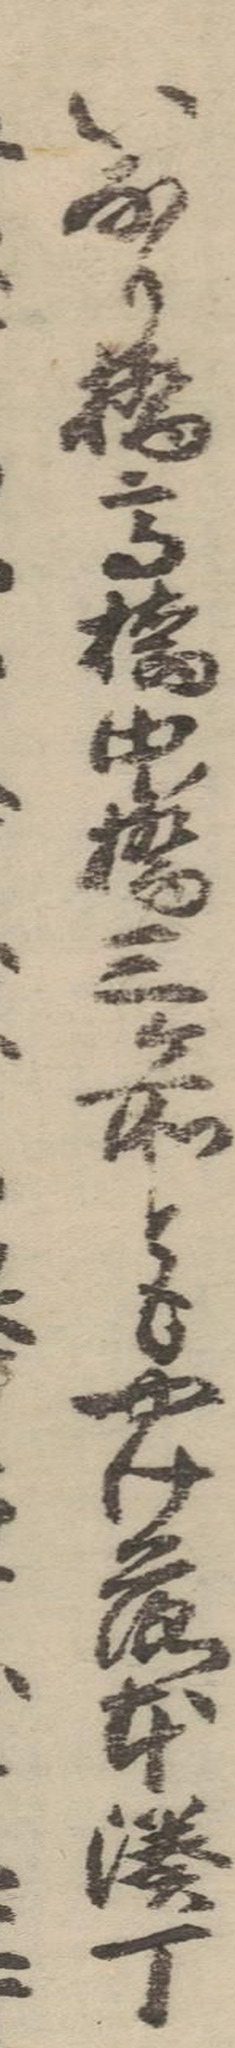いなり橋高橋中橋三ヶ所ともやけ落本湊丁
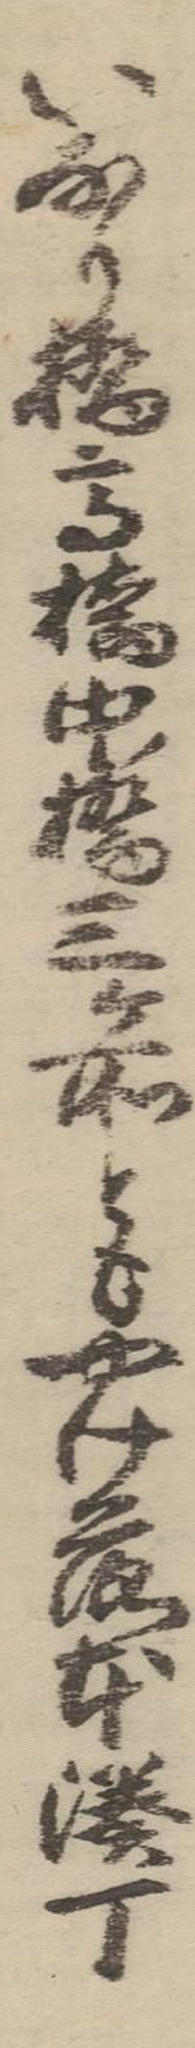いなり橋高橋中橋三ヶ所ともやけ落本湊丁
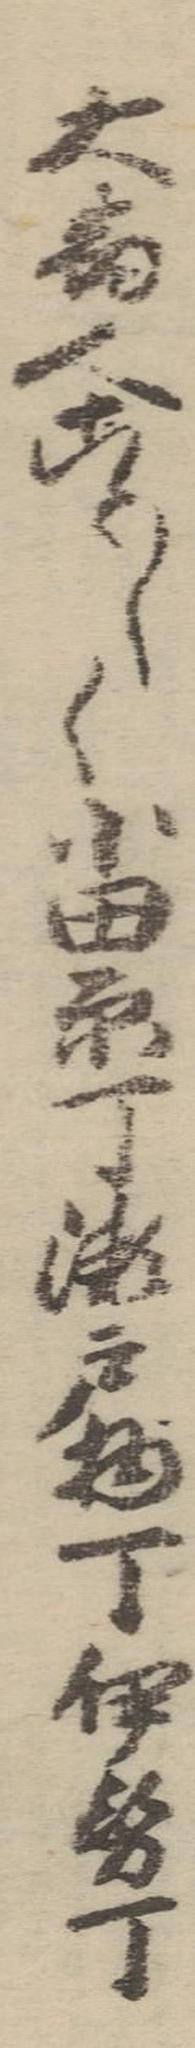大商人こと〴〵く小田原丁瀬戸物丁伊勢丁
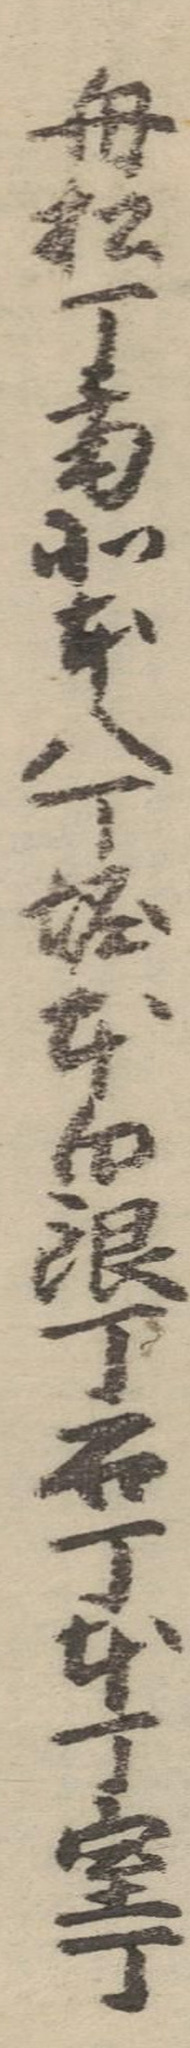舟松町南北八丁堀本白銀丁石丁本丁室丁
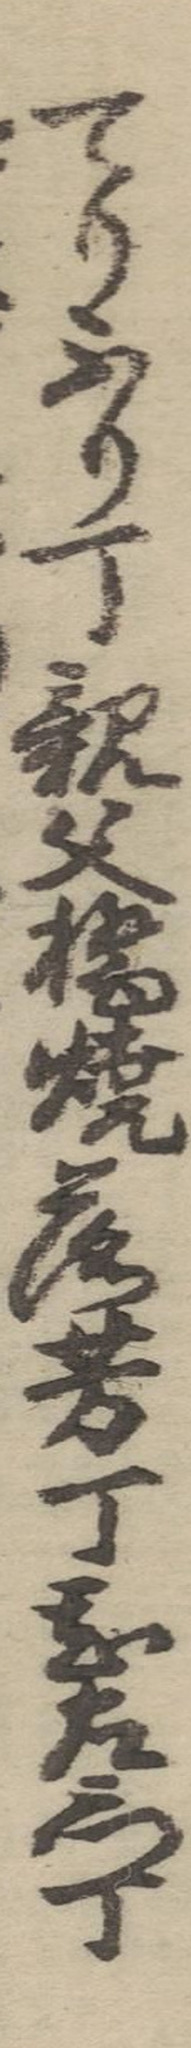てりふり丁親父橋焼落芳丁甚左衛門丁
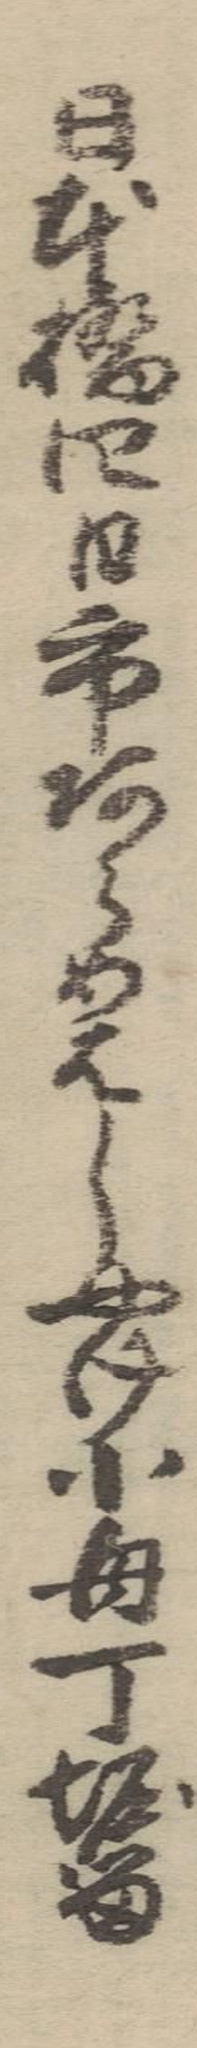日本橋四日市あらめはしやけ小舟丁堀留
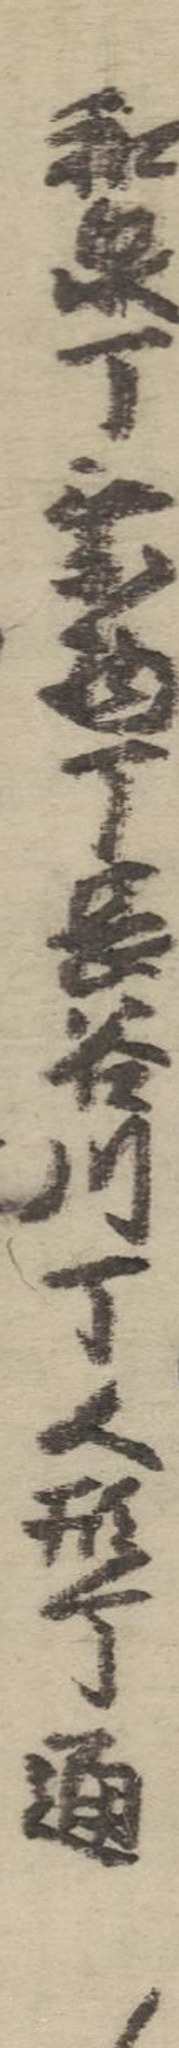和泉丁乗物丁長谷川丁人形丁通
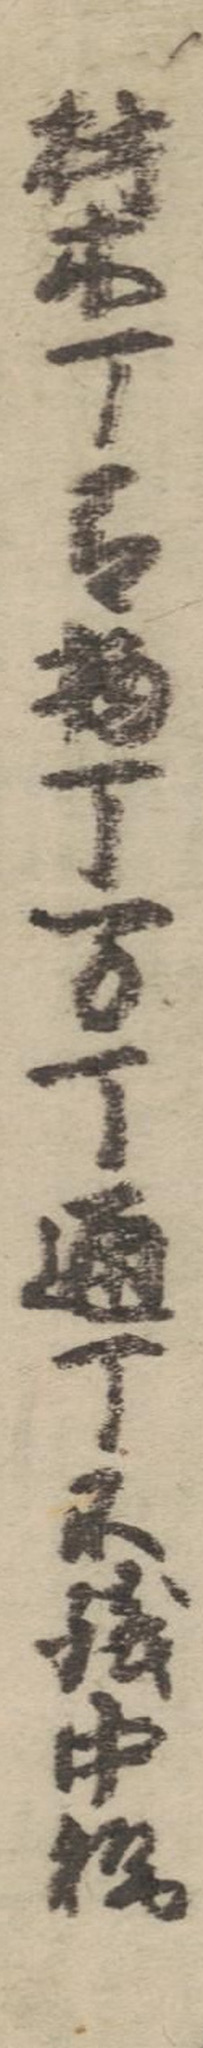新材木丁青物丁万丁通丁不残中橋
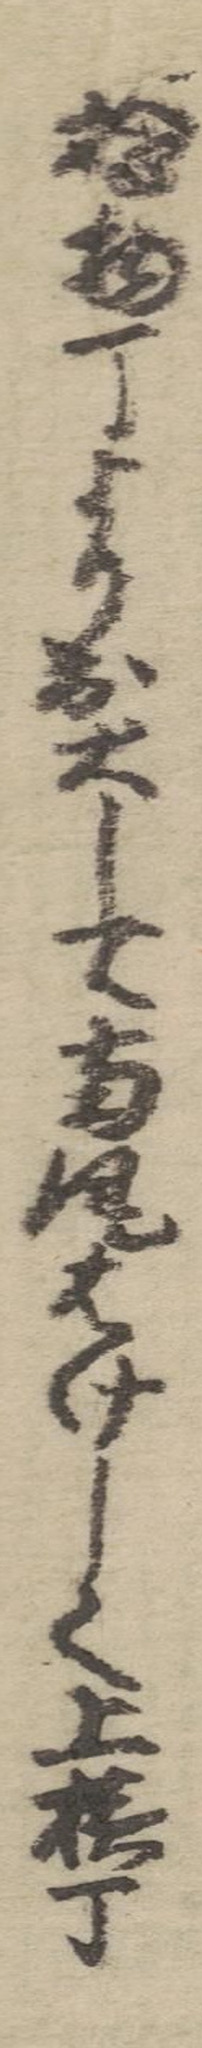檜物丁より出火して南風はけしく上槙丁
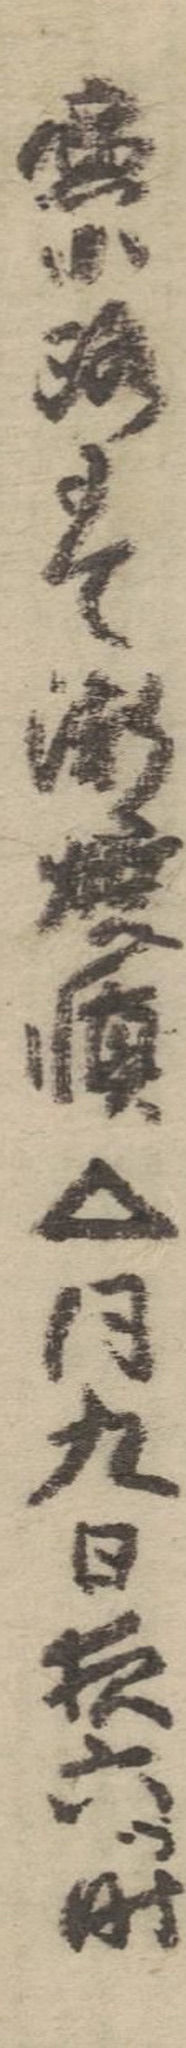広小路にて漸焼順▲同九日夜六ッ時
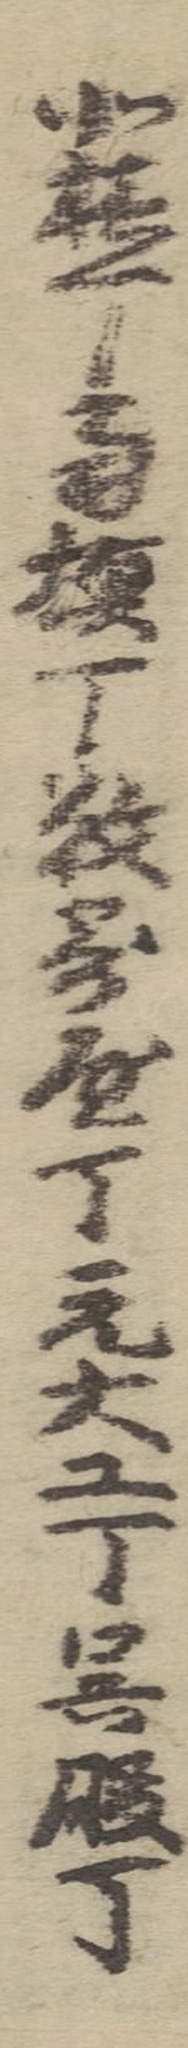北槙丁槙丁数寄屋丁元大工丁呉服丁
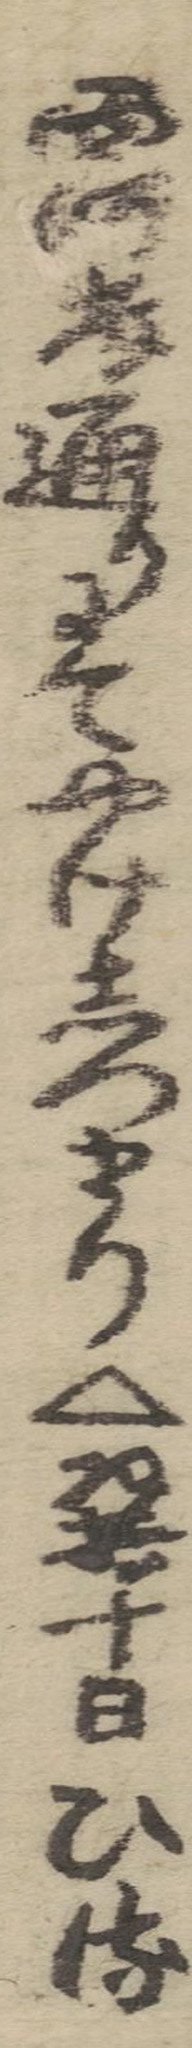西河岸通りにてやけしづまり△翌十日ひる
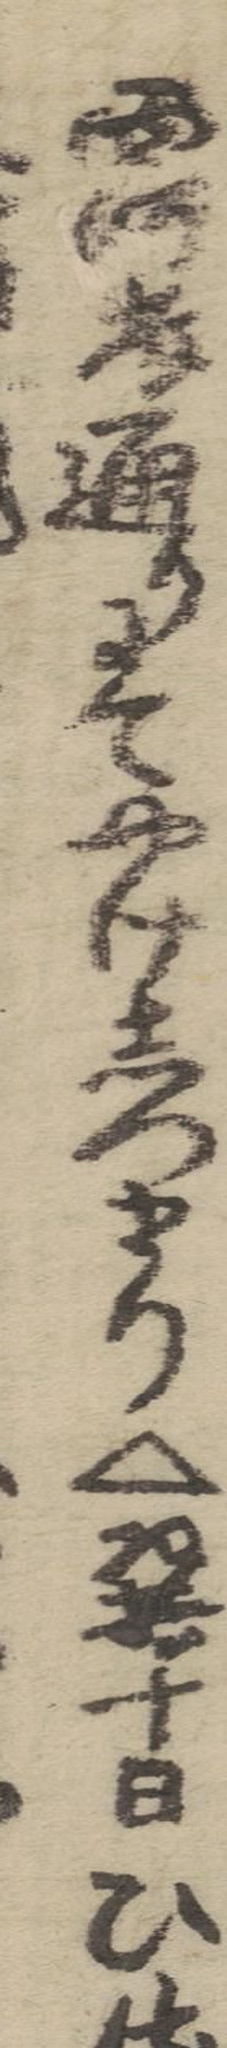西河岸通りにてやけしづまり△翌十日ひる
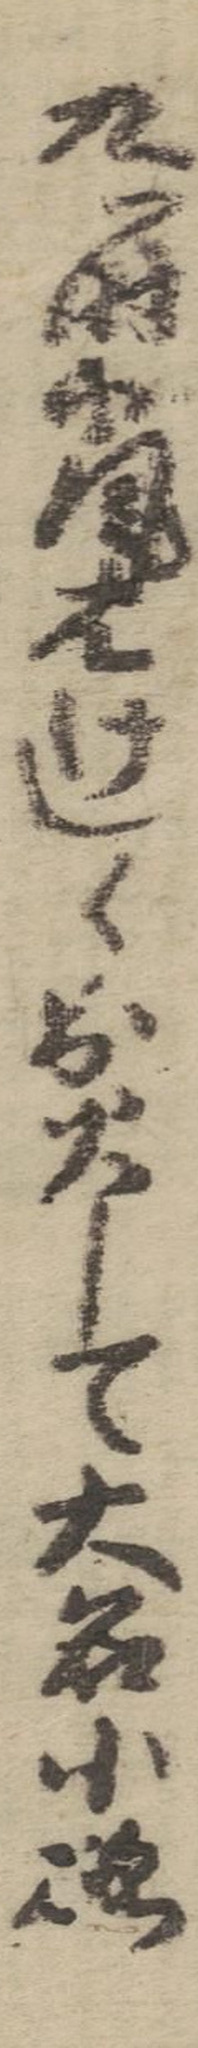九ッ北風はけしく出火して大名小路
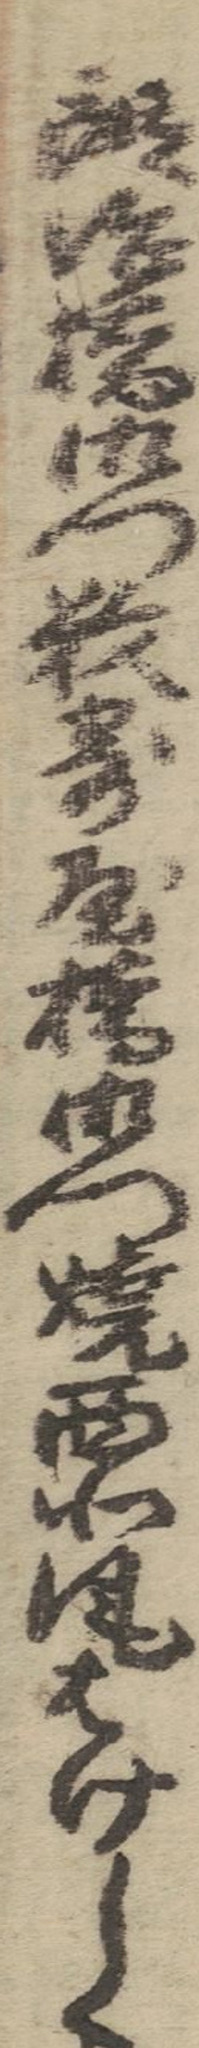鍛冶橋御門数寄屋橋御門焼西北風はけしく
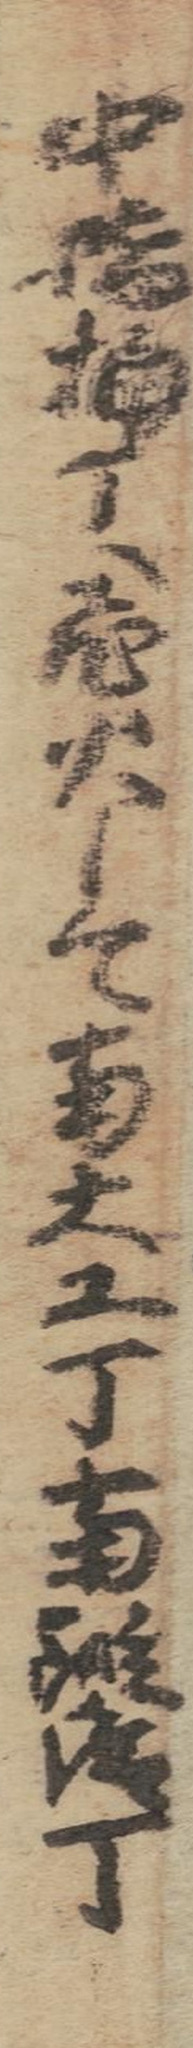中橋柏丁へ飛火して南大工丁南鍛冶丁
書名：[天保五年二月の江戸大火に関する瓦版]
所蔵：東京大学地震研究所図書室 Earthquake Research Institute Library, The University of Tokyo, JAPAN
